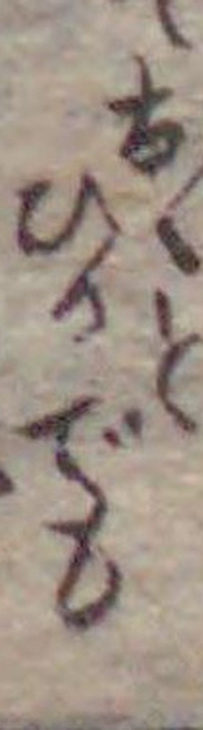ひるでも
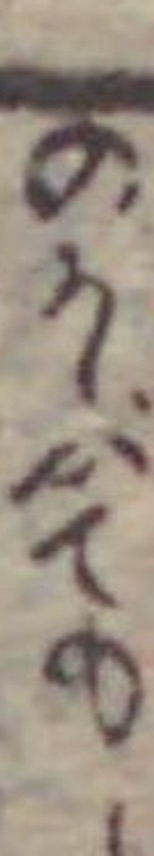のかぶても
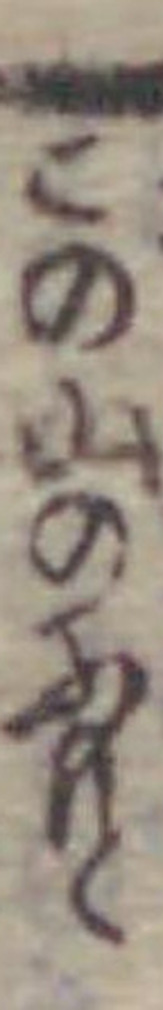この山のふもと
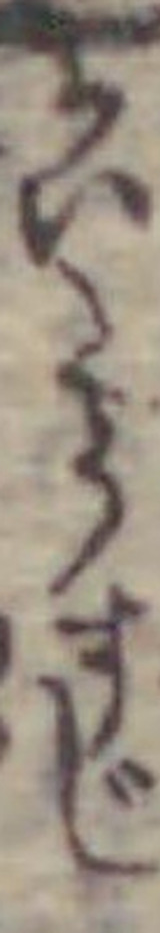かいとうすじ
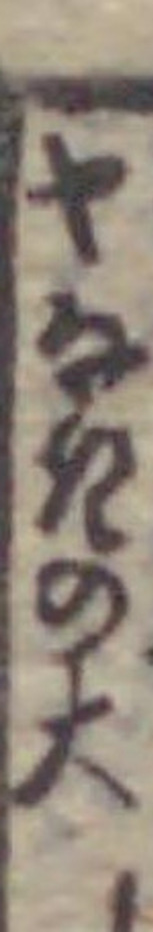やなきの大
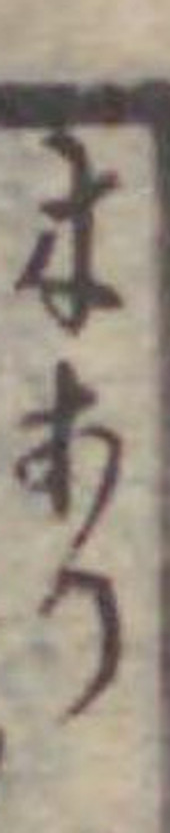木あり
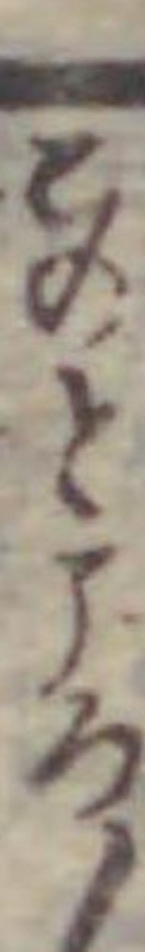このところ
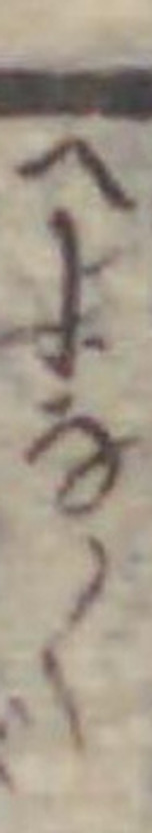へよな〳〵
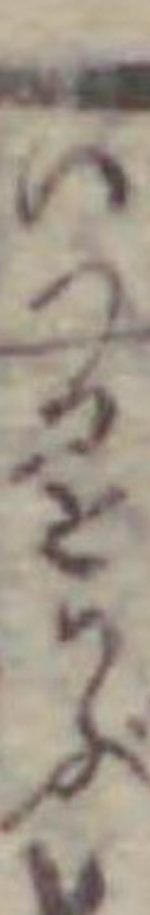いつるとかぶ
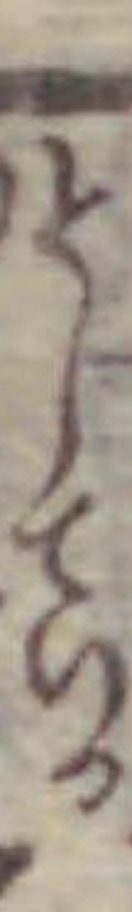としている
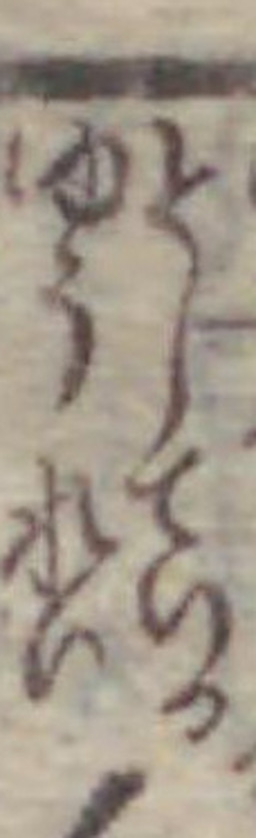ゆうれい
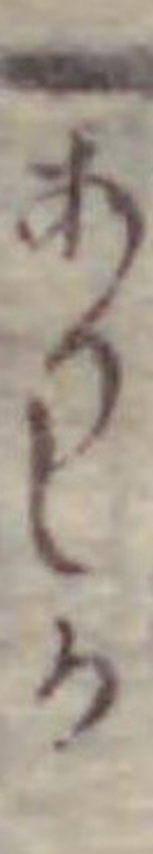ありしか
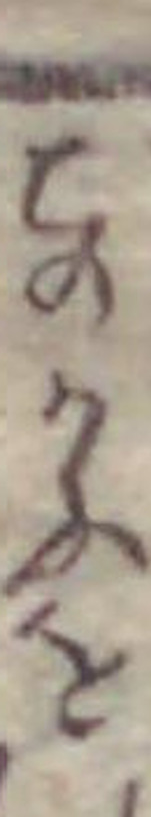このかふを
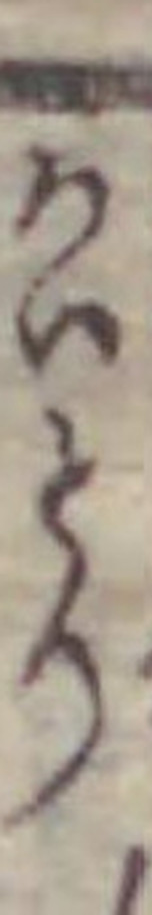かいとり
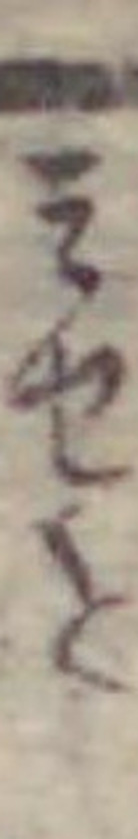みせを
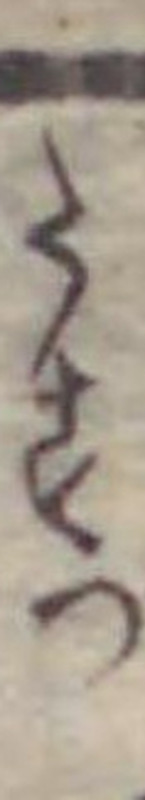たすつ
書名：化物見世開 : 2巻
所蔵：国立国会図書館 National Diet Library, JAPAN
